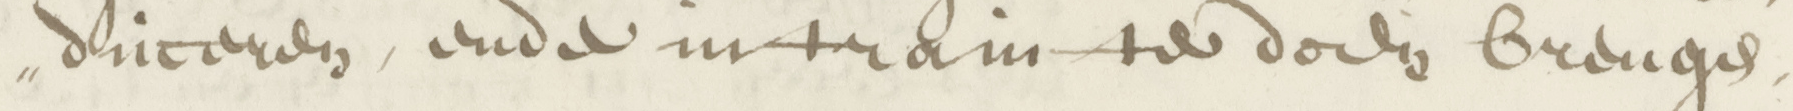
duceren ende intrain te doen brengen.
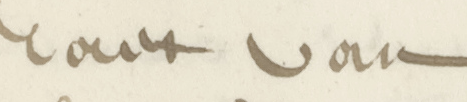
raet van
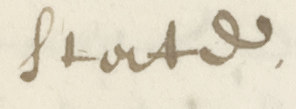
State
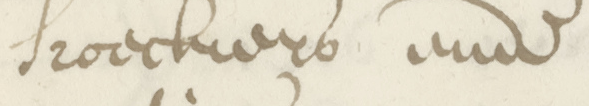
hoeckers ende
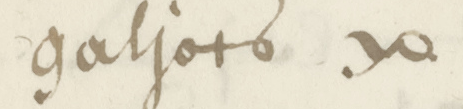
galjots p.
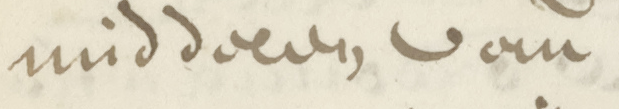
middelen vand.
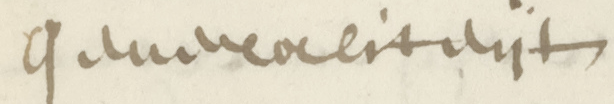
generaliteijt
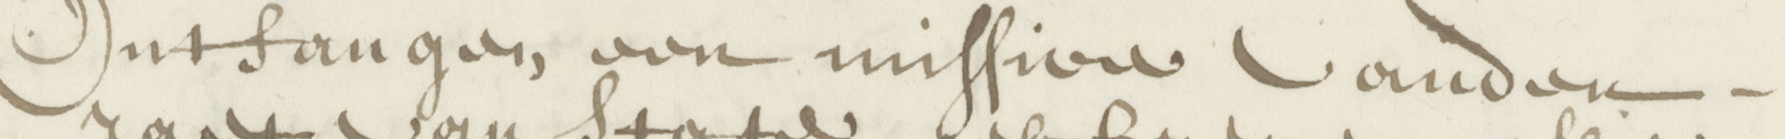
Ontfangen een missive vanden
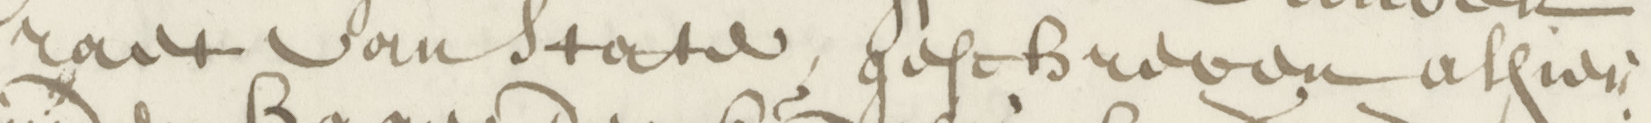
raet van State, geschreven alhier
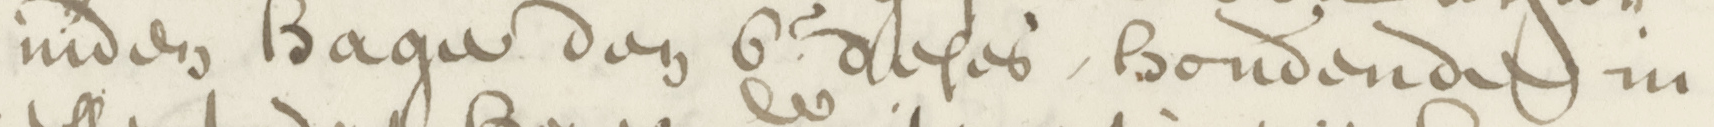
inden Hage den 6e deses, houdende in
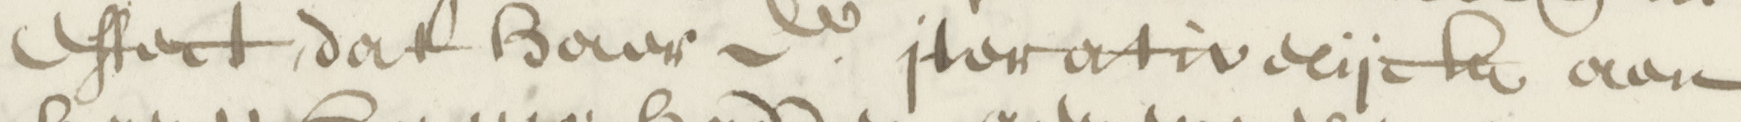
effect dat haer E. iterativelijck aen
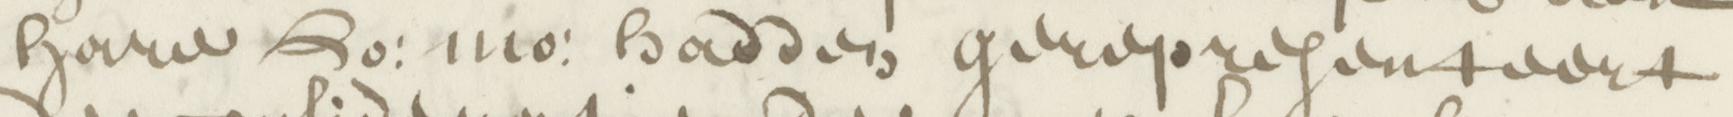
hare Ho:Mo: hadden gerepresenteert
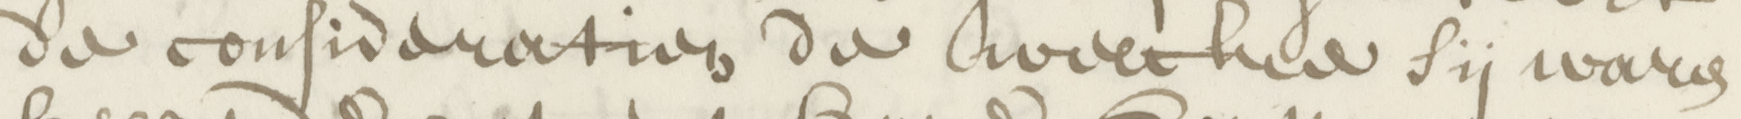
de consideratien de welcke sij waren
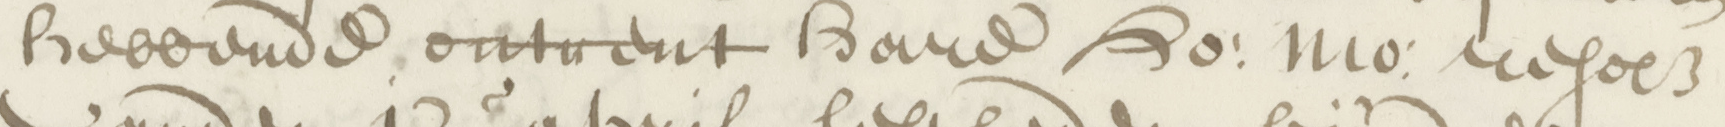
hebbende ontrent haere Ho:Mo: resol
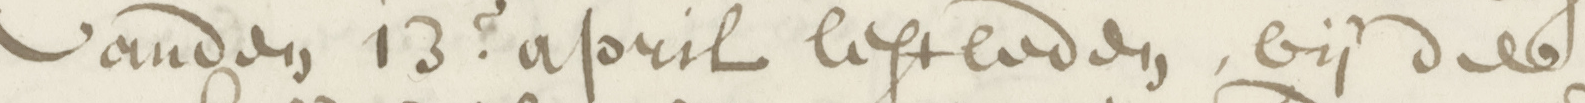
vanden 13e april lestleden, bij de —
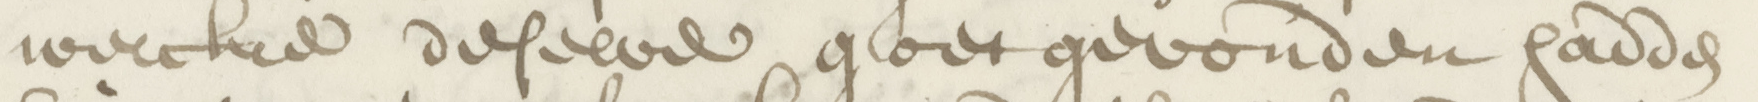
welcke deselve goet gevonden hadden
